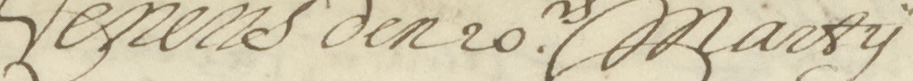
Veneris den 20en. Martij
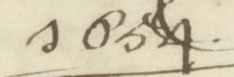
1654
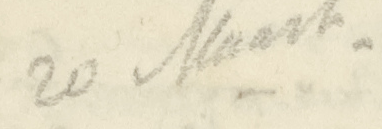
20 Maart
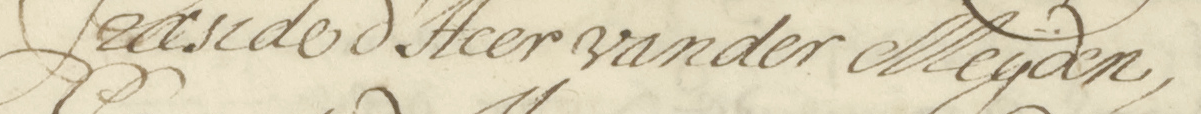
Præside d' Heer van der Meijden,
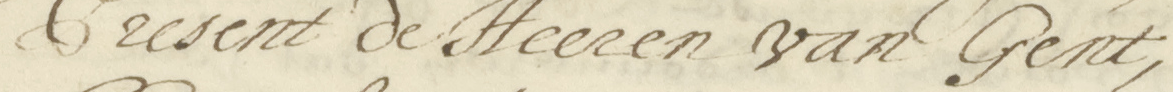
Present de Heeren van Gent
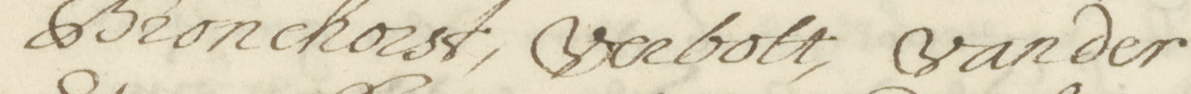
Bronchorst, Verbolt, van der
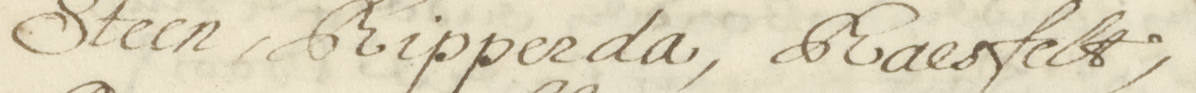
Steen, Ripperda, Raesfelt,
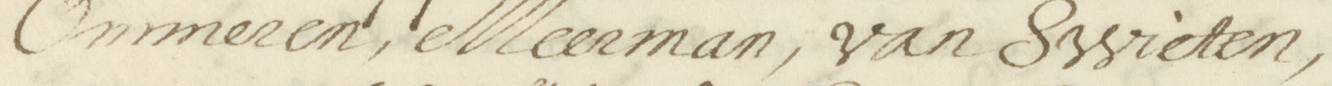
Ommeren, Meerman, van Swieten,
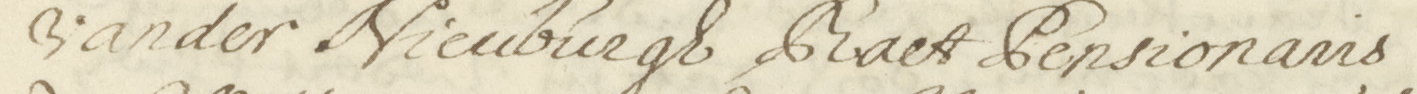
van der Nieuburgh, Raet Pensionaris
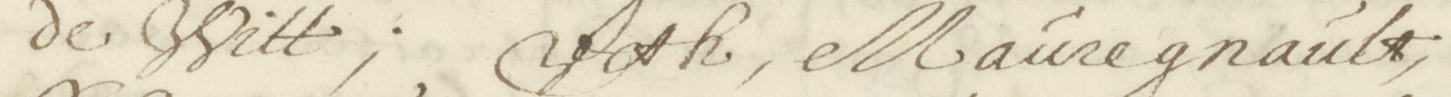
de Witt; Veth, Mauregnault;
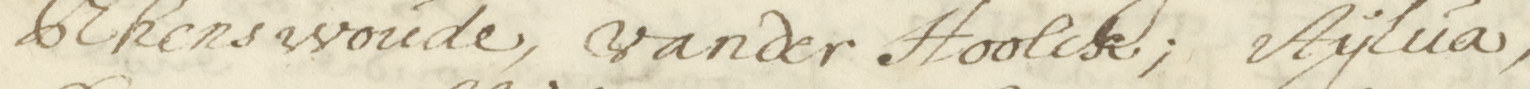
Rhenswoude, van der Hoolck; Aijlua
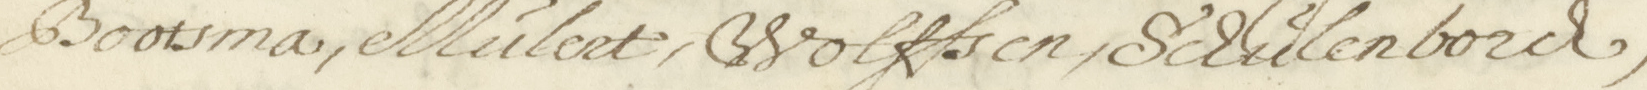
Bootsma, Mulert, Wolffsen, Schulenborch,
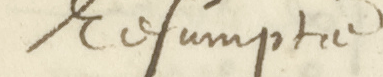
resumptie
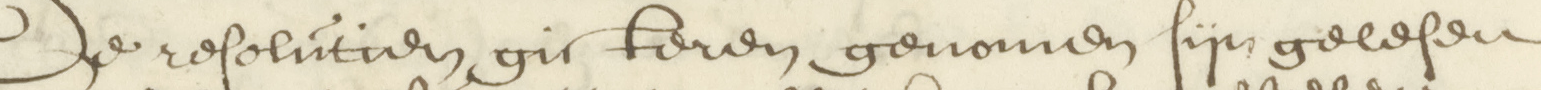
De resolutien gisteren genomen sijn gelesen
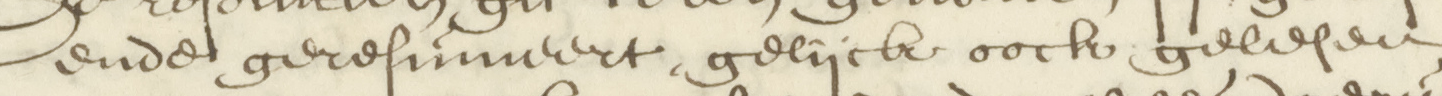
ende geresumeert, gelijck oock gelesen
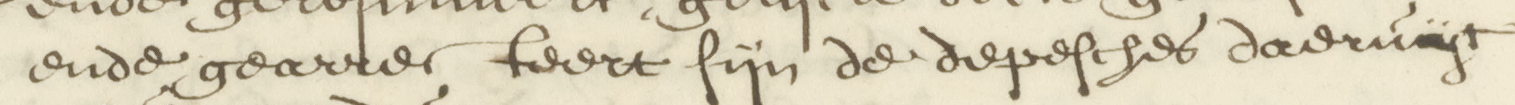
ende gearresteert sijn de depesches daeruijt
